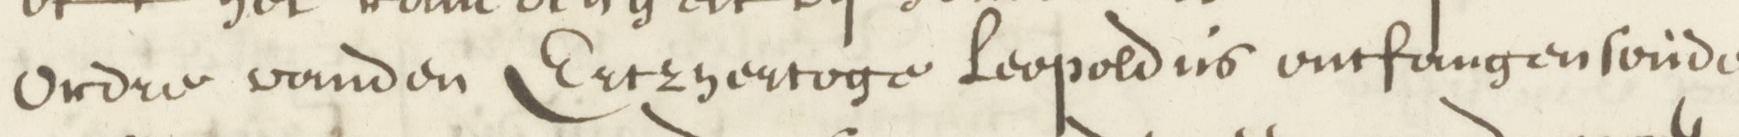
Ordre vanden Ertzhertoge Leopoldus ontfangen soude
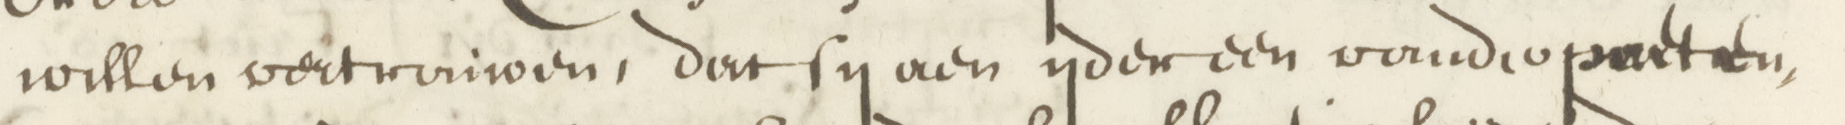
willen vertrouwen, dat sy aen yder een vande paeten,
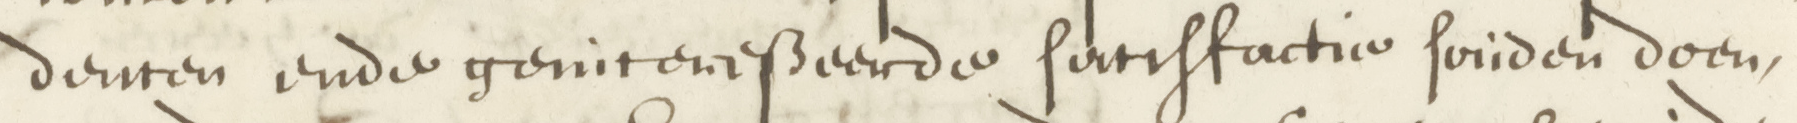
denten ende geinteresseerde satisfactie souden doen,
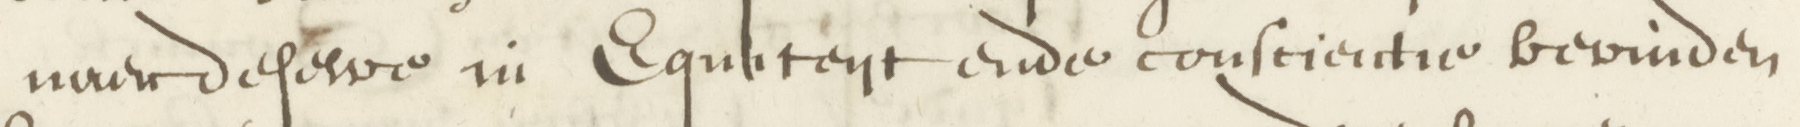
naer deselve in Equiteyt ende conscientie bevinden
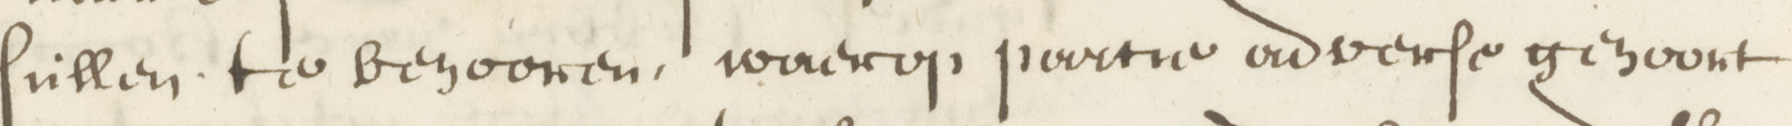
sullen te behooren, waerop partie adverse gehoort
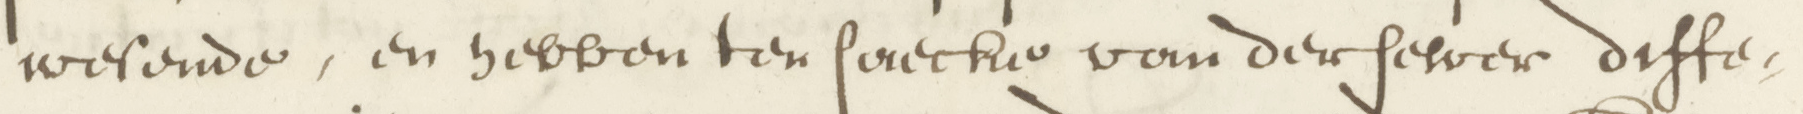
wesende, en hebben ter saecke van derselver diffe,
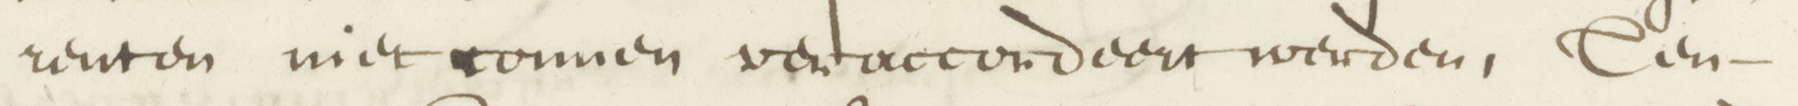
renten niet connen veraccordeert werden. Ten
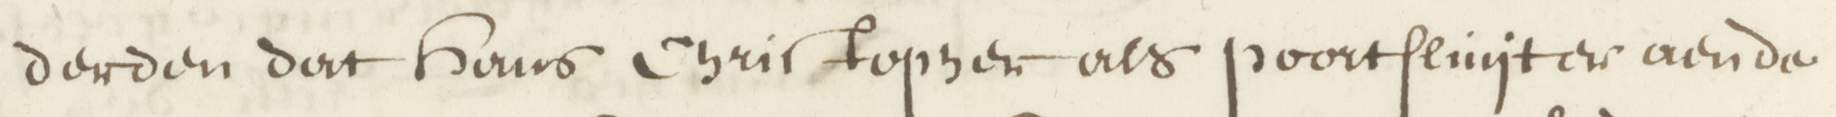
derden dat Hans Christopher als poortsluijter aen de
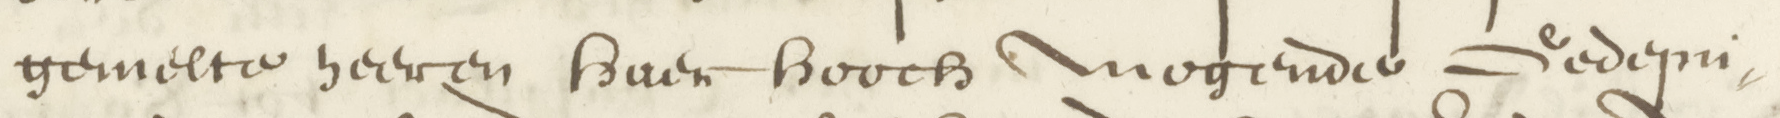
gemelte heeren haer hooch mogende Gedepu„
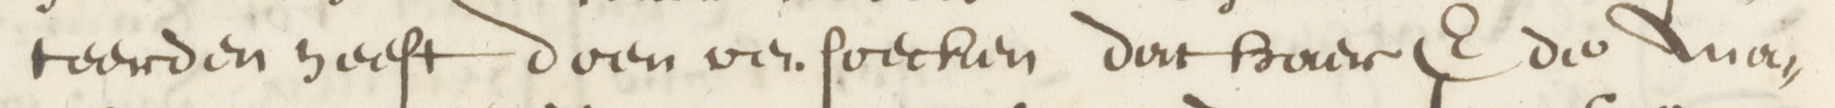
teerden heeft doen versoecken dat haer E de Ma,,
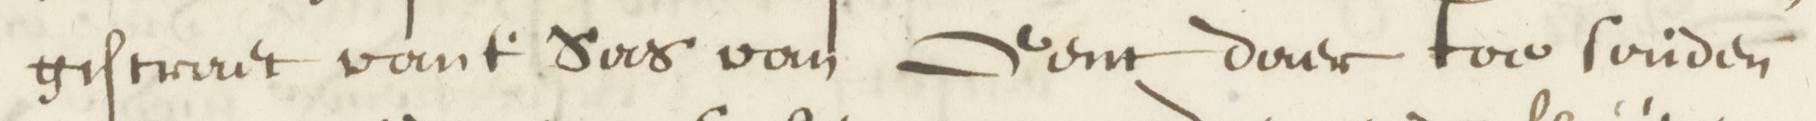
gistraet vant' Sas van Gent daer toe souden
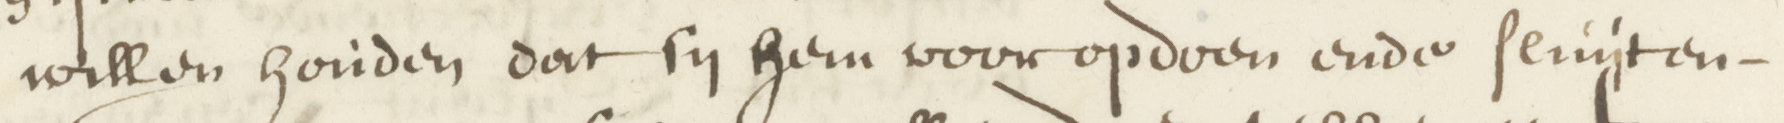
willen houden dat sy hem voor opdoen ende sluijten
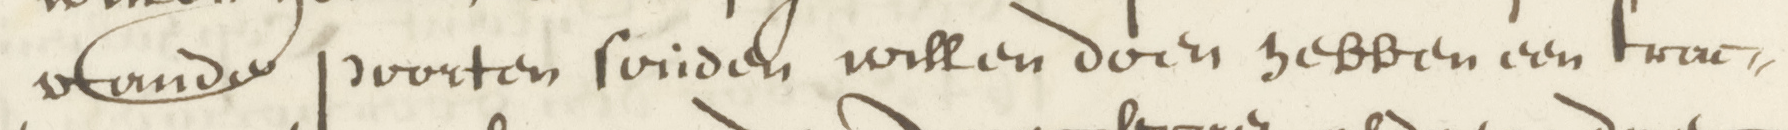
vande poorten souden willen doen hebben een trac,,
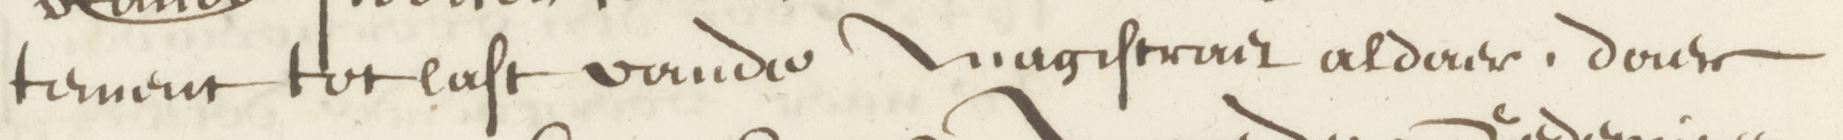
tement tot last vande Magistraet aldaer, daer
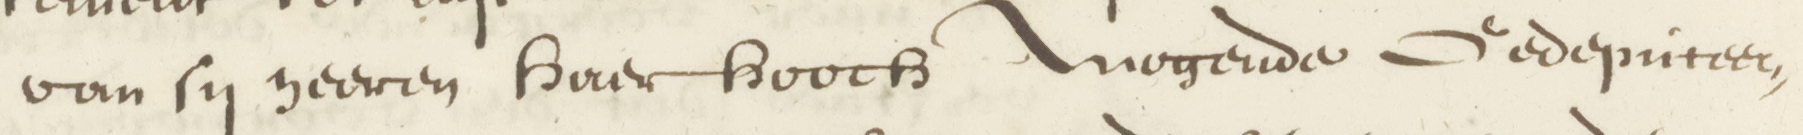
van sy heeren haer hooch mogende Gedeputeer,,
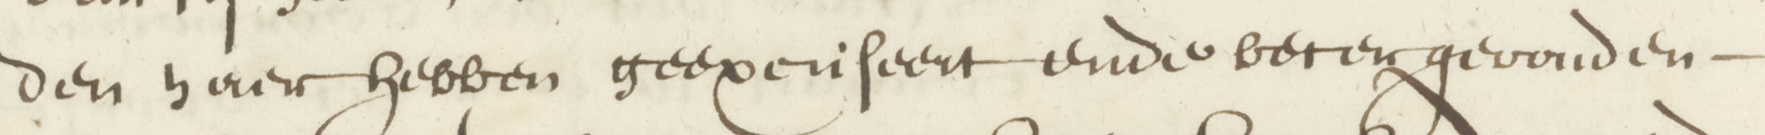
den haer hebben geexcuseert ende beter gevonden
